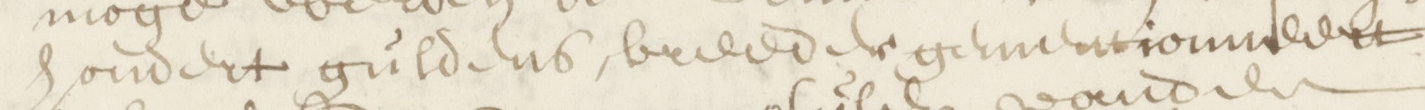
hondert guldens, breeder gementionneert
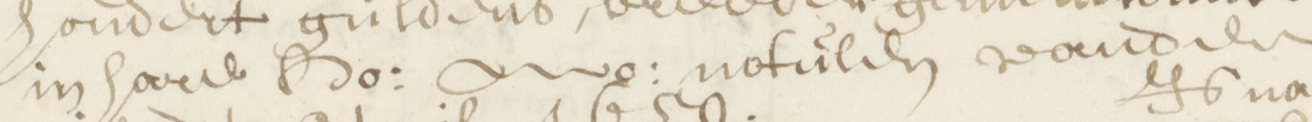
in hare Ho:Mo: notulen vanden
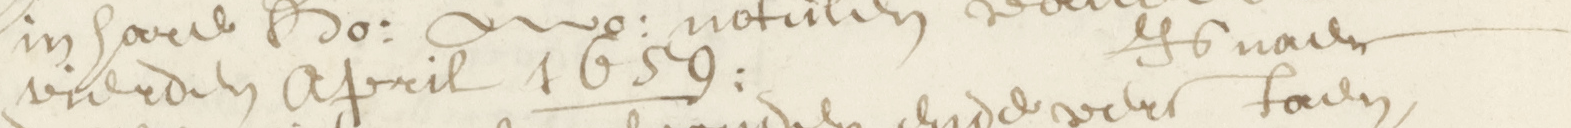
vierden april 1659. Is naer
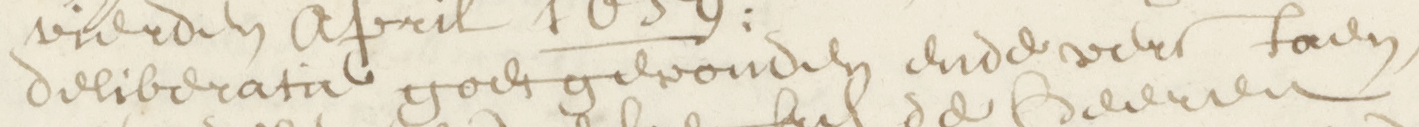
deliberatie goetgevonden ende verstaen,
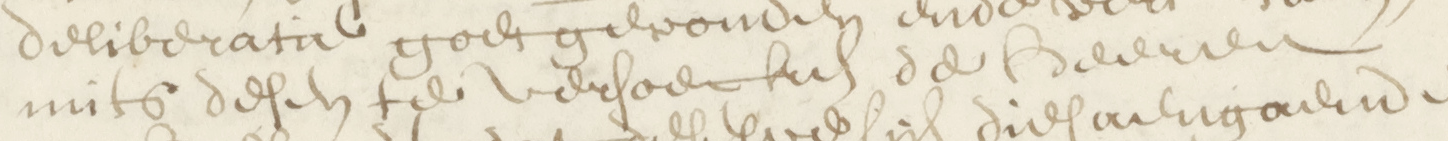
mits desen te versoecken de Heeren
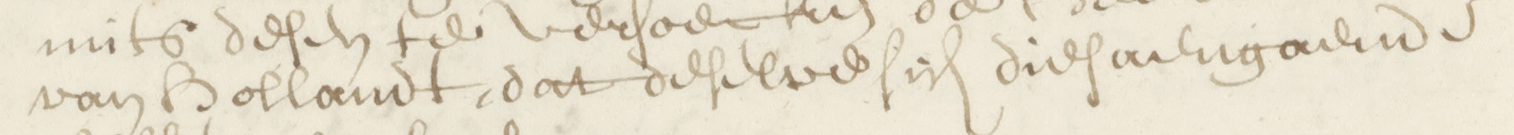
van Hollandt, dat deselve sich diesaengaende
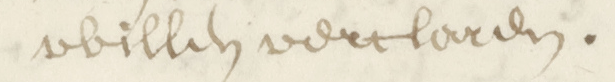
willen verclaren.
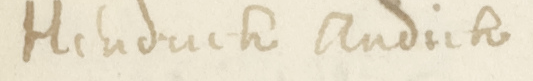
Hendrick Audick
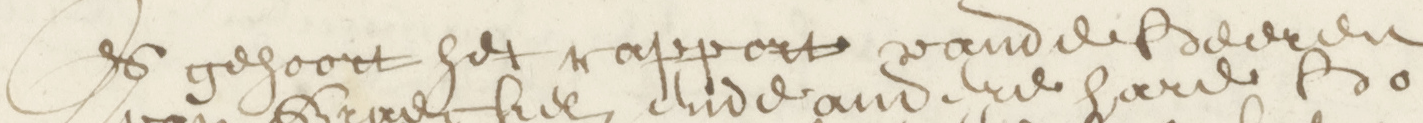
Is gehoort het rapport vande Heeren
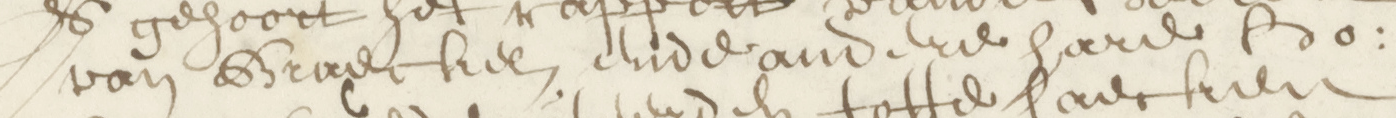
van Braeckel, ende andere hare Ho:
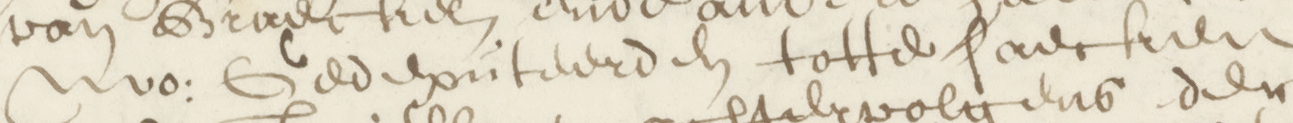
Mo: Gedeputeerden totte saecken
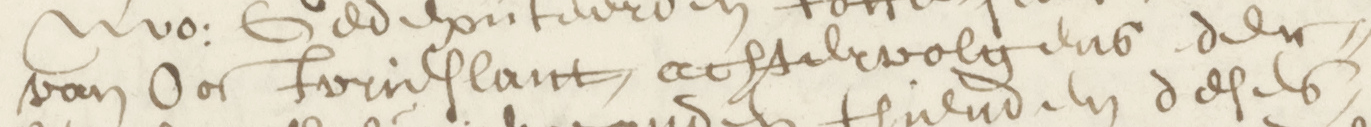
van Oostvrieslant, achtervolgens der„
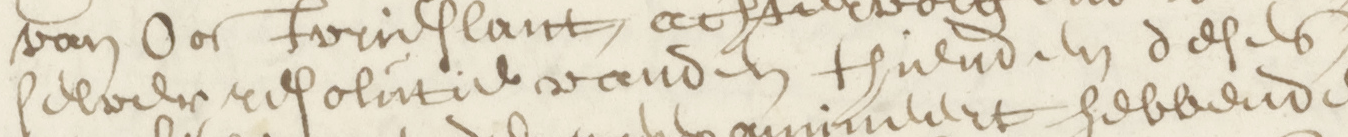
selver resolutie vanden thienden deses
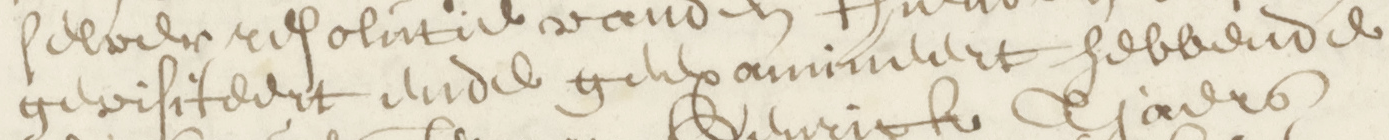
gevisiteert ende geexamineert hebbende
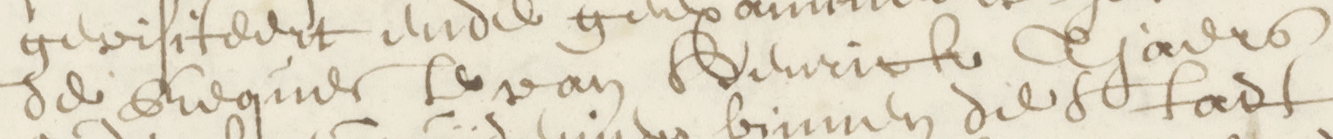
de Requeste van Henrick Tjaers
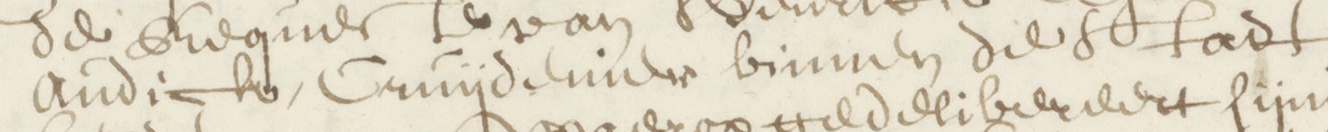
Audick, Cruijdenier binnen de Stadt
